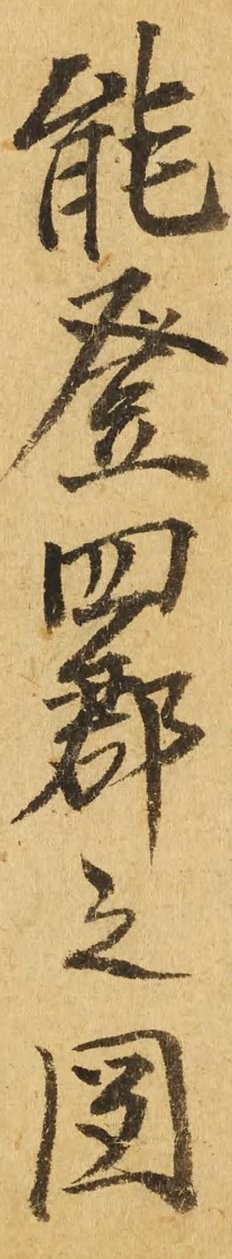能登四郡之図
